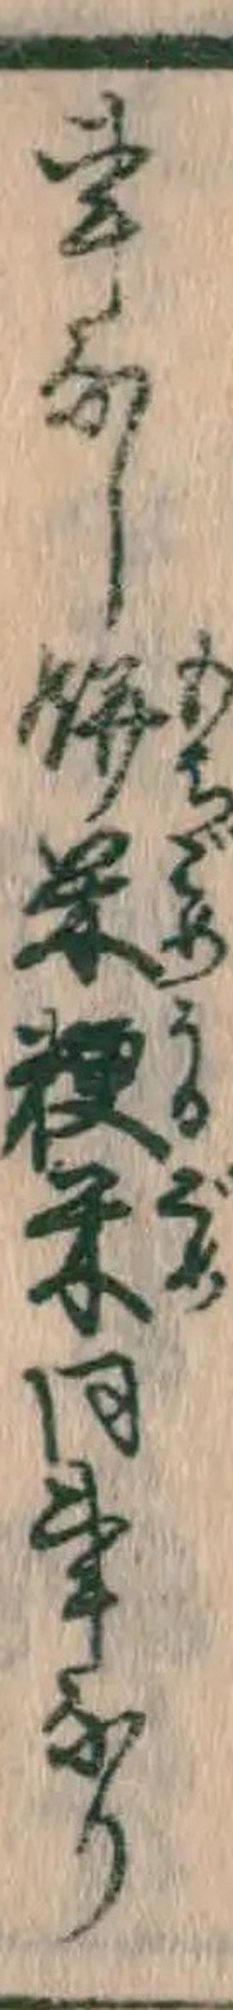事なし餅米粳米同事なり
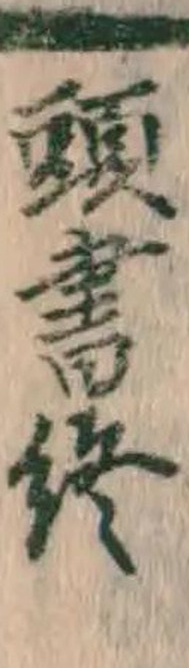頭書終
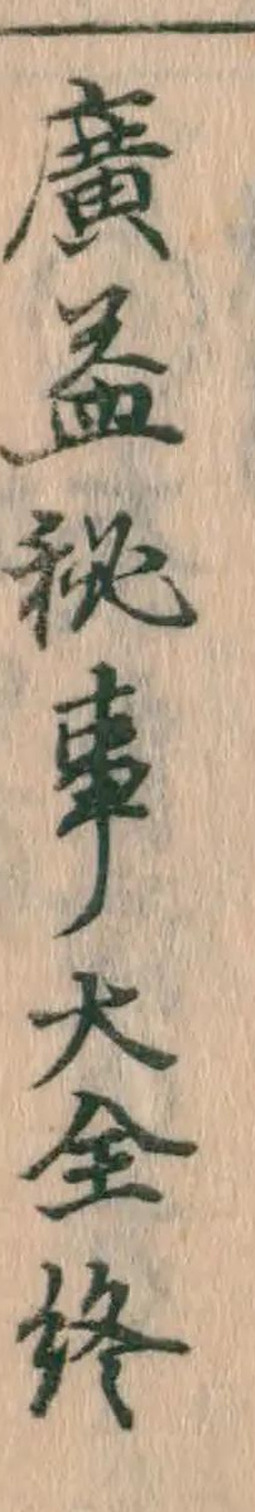広益秘事大全終
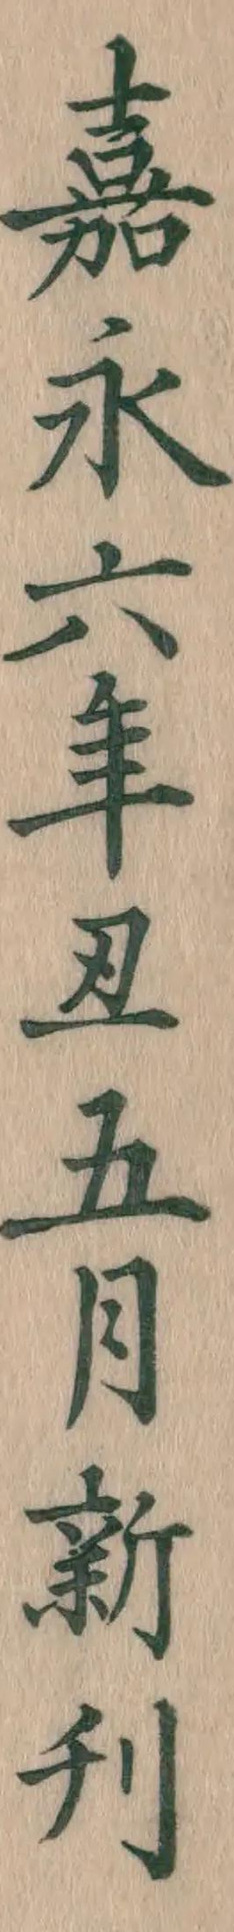嘉永六年丑五月新刊
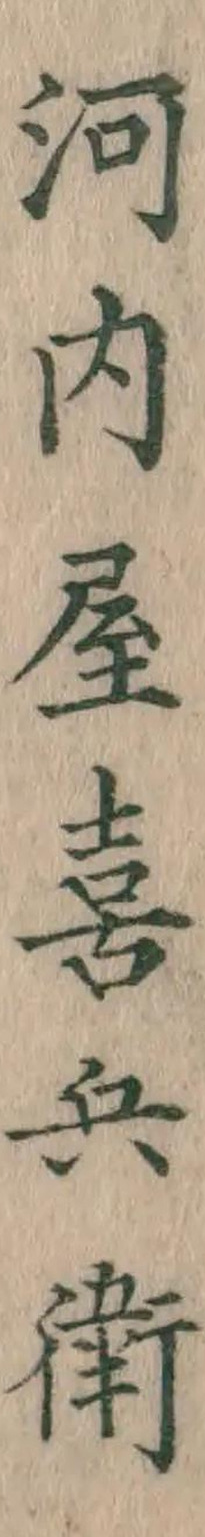河内屋喜兵衛
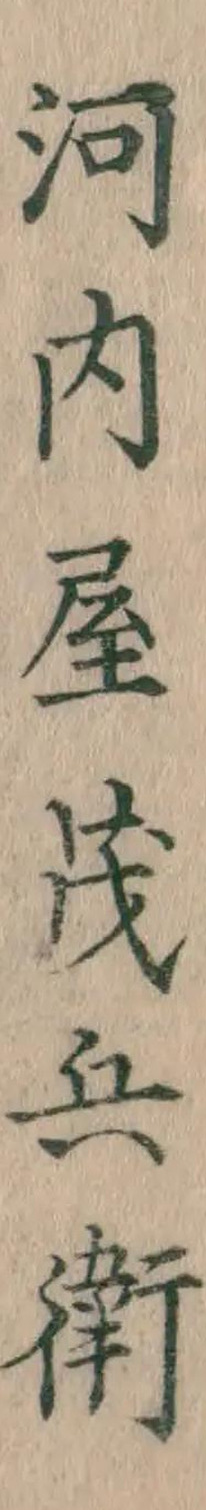河内屋喜兵衛
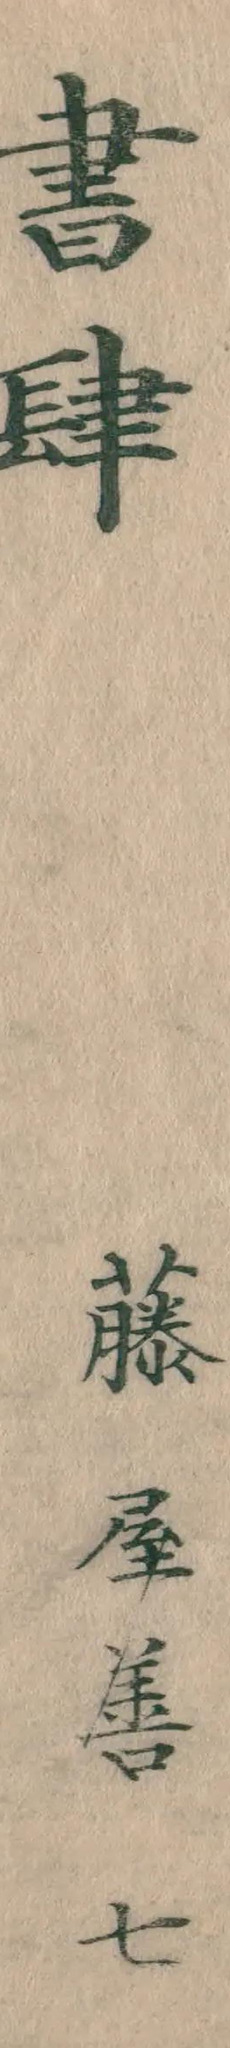書肆藤屋善七
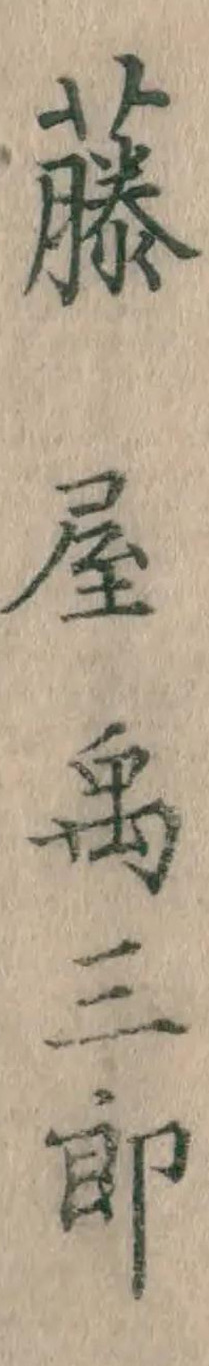藤屋禹三郎
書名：広益秘事大全 3巻. [5]
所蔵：国立国会図書館 National Diet Library, JAPAN
